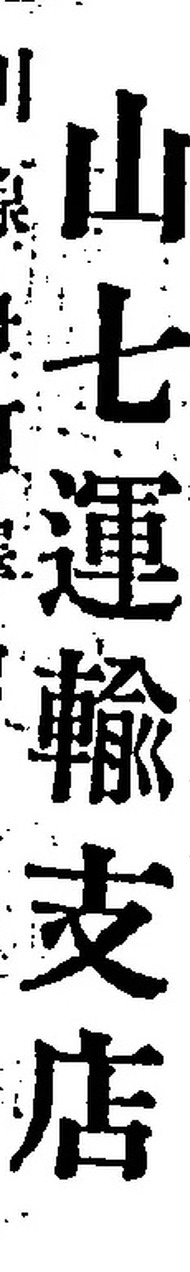山七運輸支店
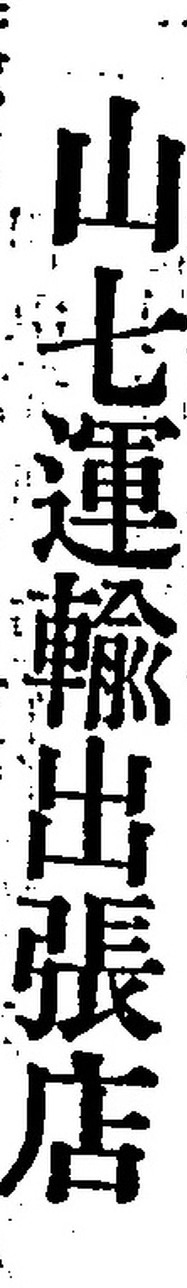山七運輸出張店
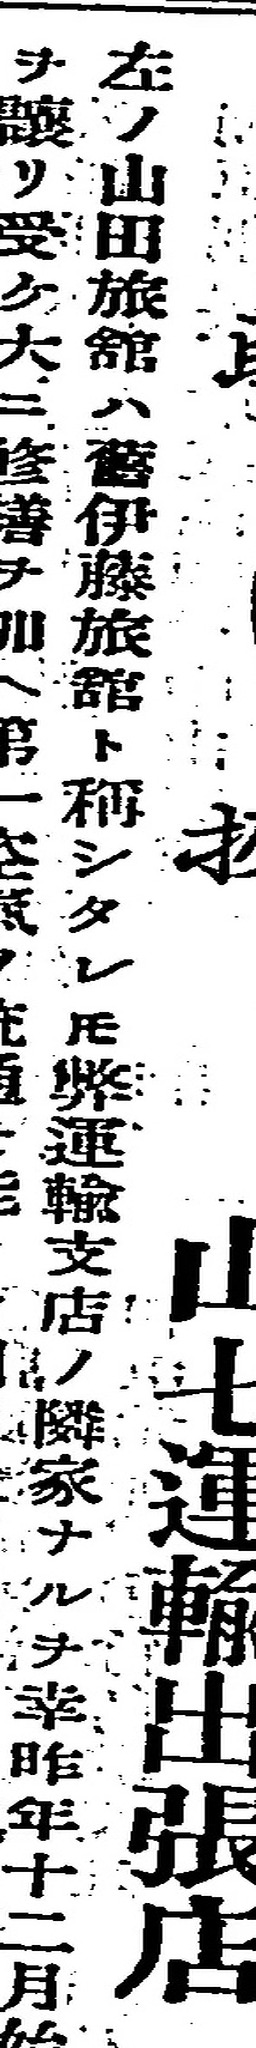左ノ山田旅舘ハ旧伊藤旅舘ト称シタレ𪜈弊運輸支店ノ隣家ナルヲ幸昨年十二月始テ其家
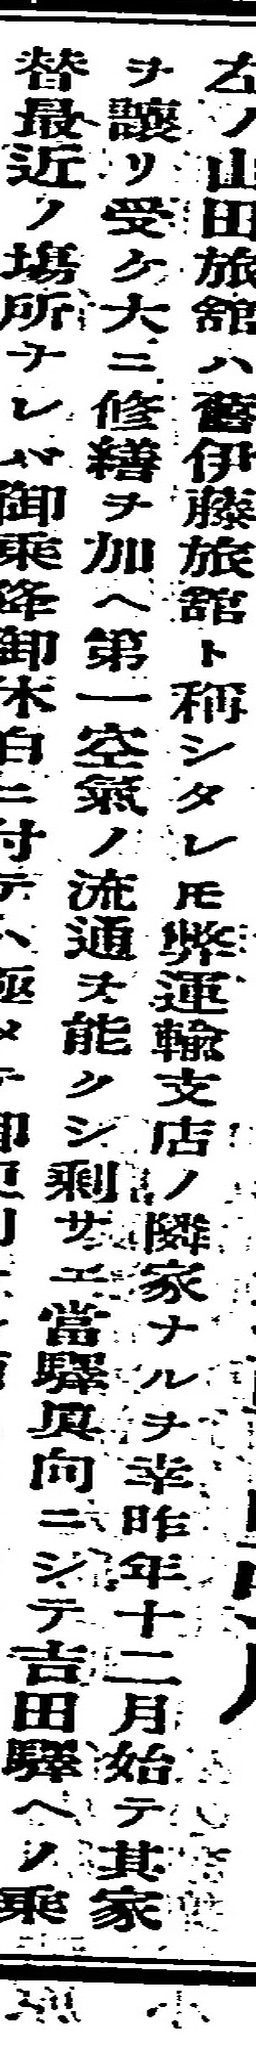ヲ譲リ受ケ大ニ修繕ヲ加ヘ第一空気ノ流通ヲ能クシ剰サエ当駅真向ニシテ吉田駅ヘノ乗
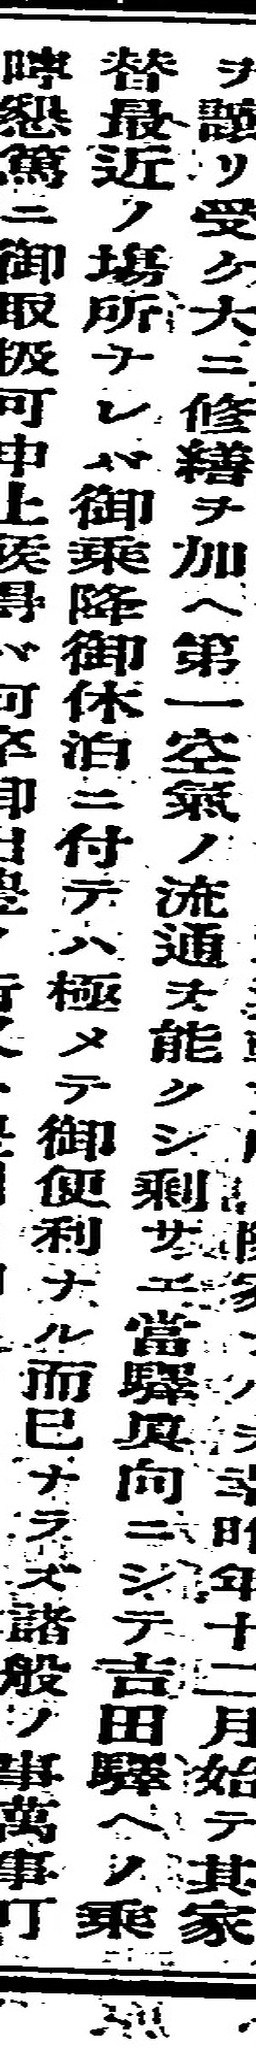替最近ノ場所ナレバ御乗降御休泊ニ付テハ極メテ御便利ナル而巳ナラズ諸般ノ事万事叮
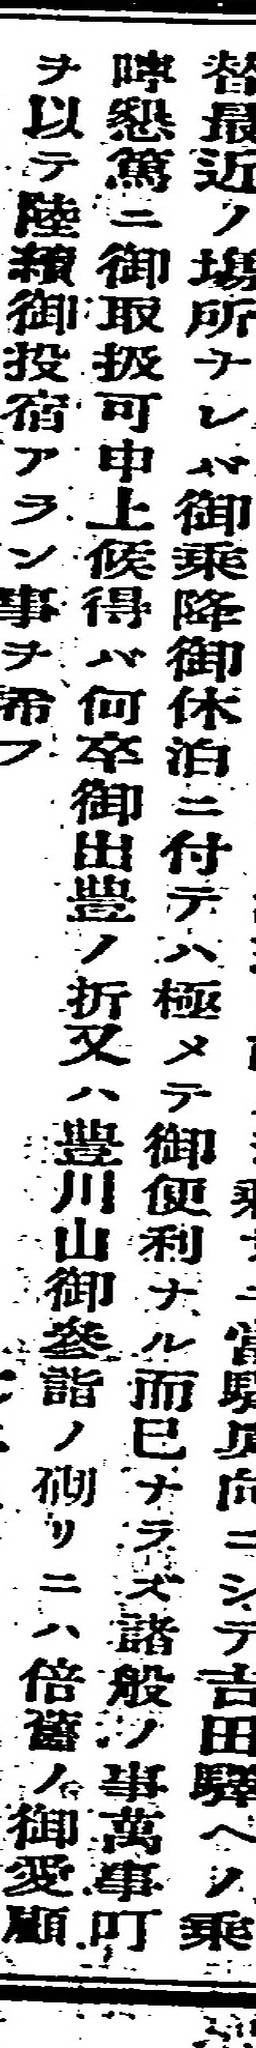嚀懇篤ニ御取扱可申上候得バ何卒御出豊ノ折又ハ豊川山御参詣ノ砌リニハ倍旧ノ御愛顧
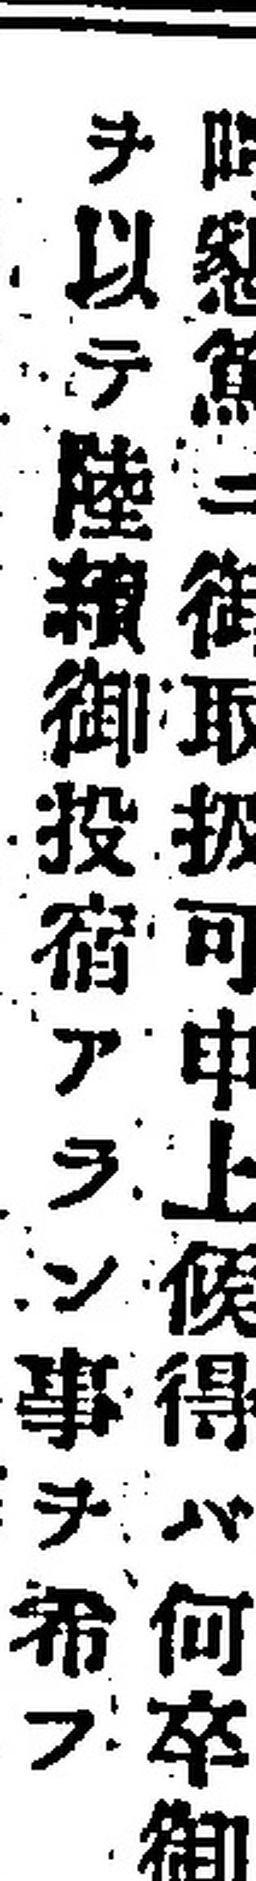ヲ以テ陸続御投宿アラン事ヲ希フ謹白
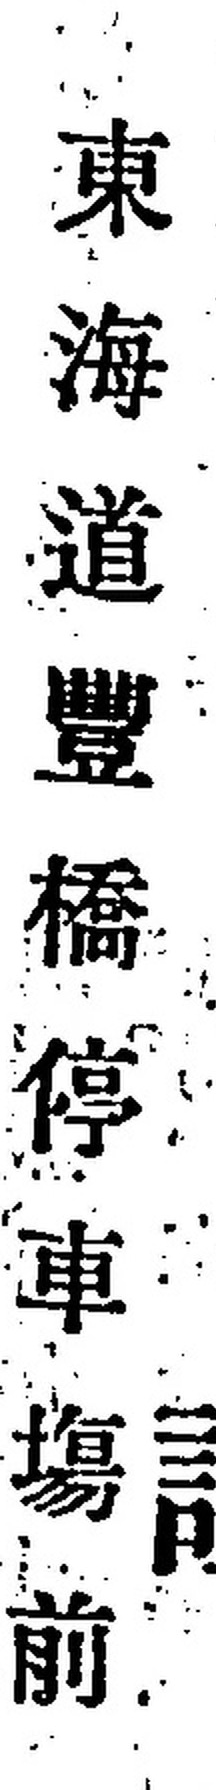東海道豊橋停車場前
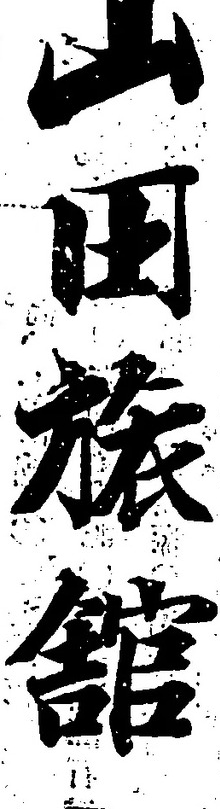山田旅舘
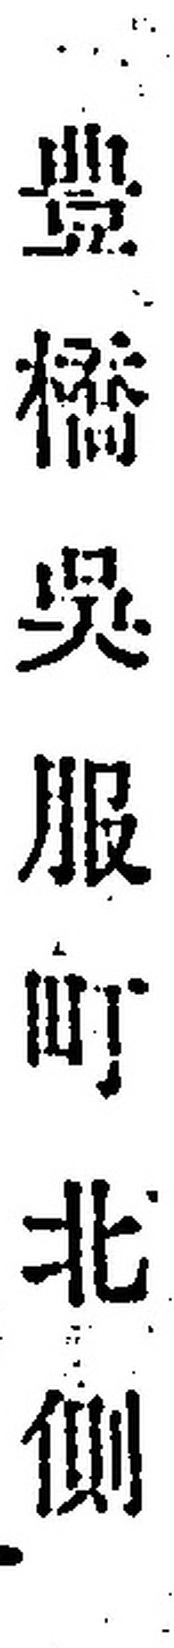豊橋呉服町北側
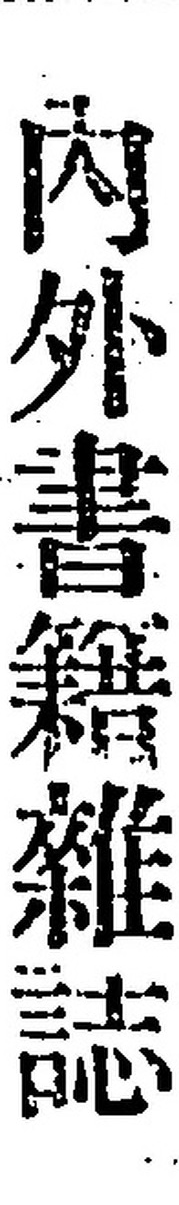内外書籍雑誌
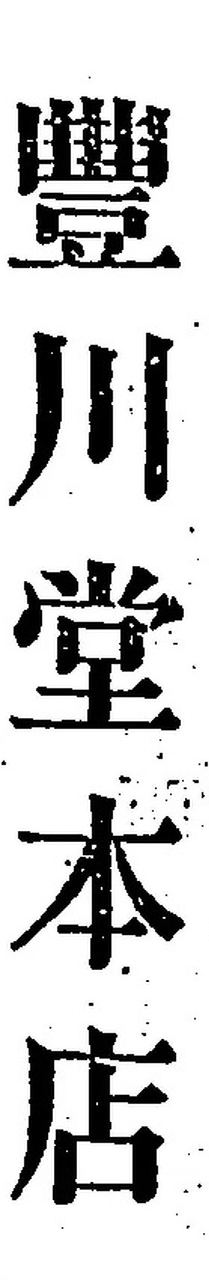豊川堂本店
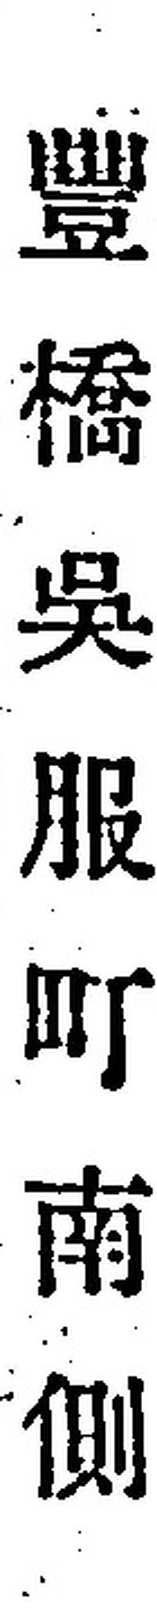豊橋呉服町南側
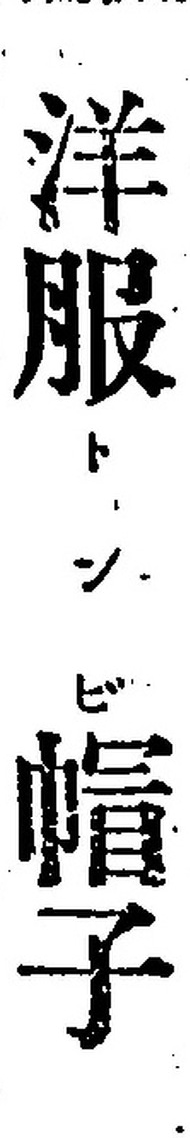洋服トンビ帽子
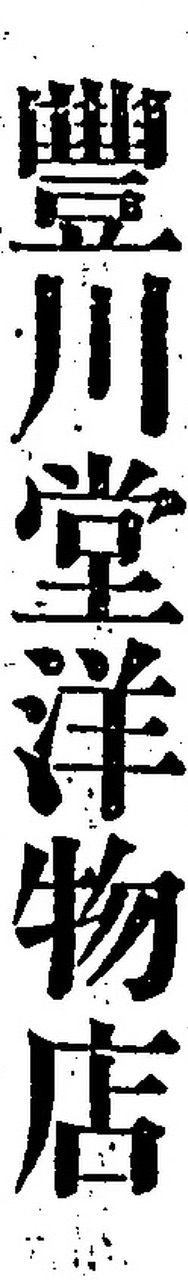豊川堂洋物店
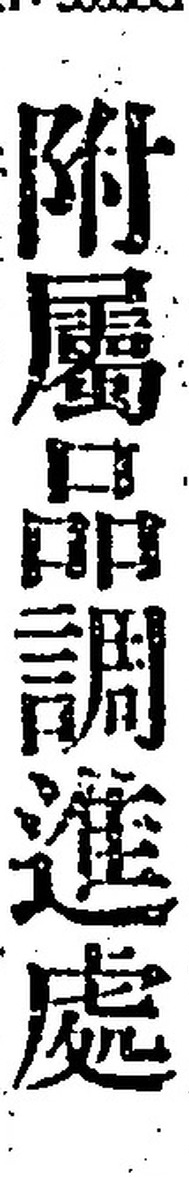附属品調進処
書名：東参名勝案内
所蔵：国立国会図書館 National Diet Library, JAPAN
